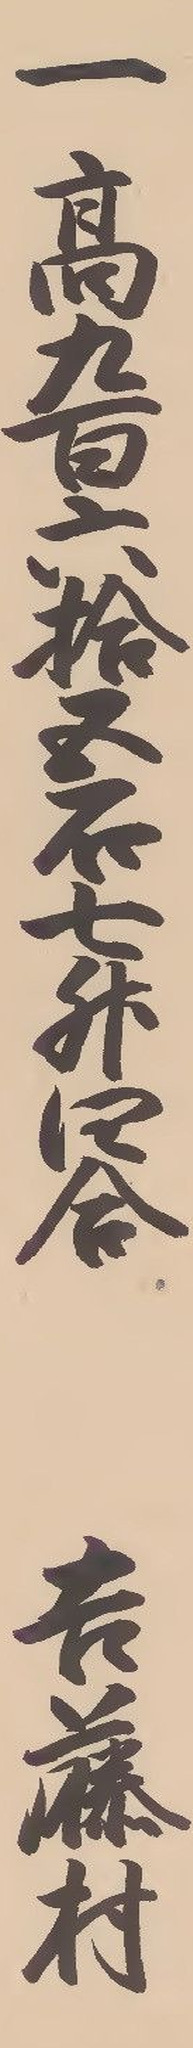一高九百六拾五石七升四合吉藤村

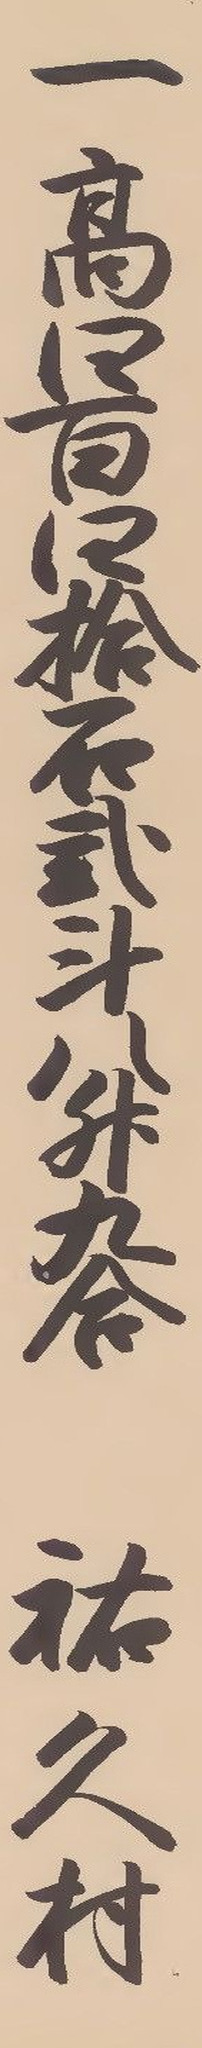一高四百四拾石弐斗八升九合祐久村
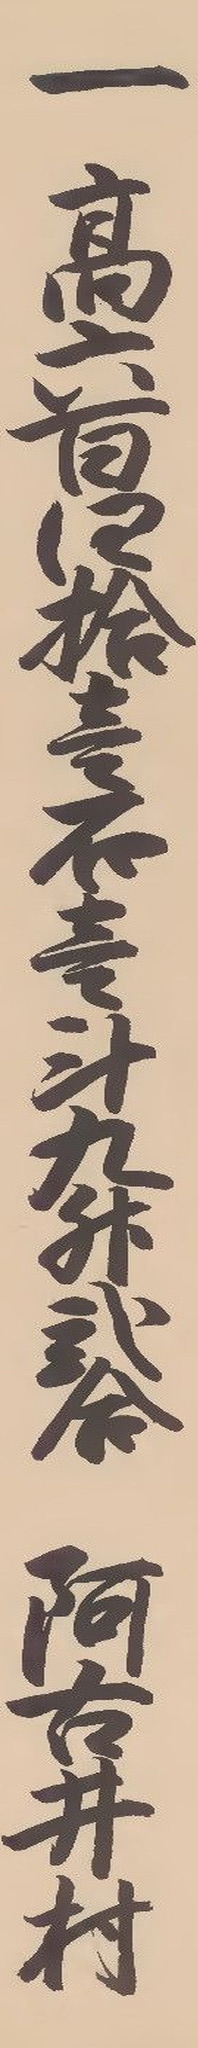一高六百四拾壱石壱斗九升弐合阿古井村
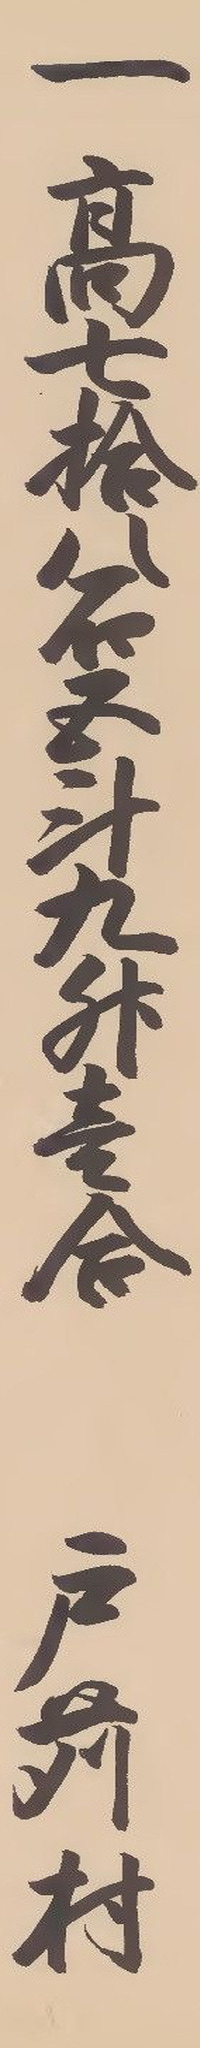一高七拾八石五斗九升壱合戸苅村
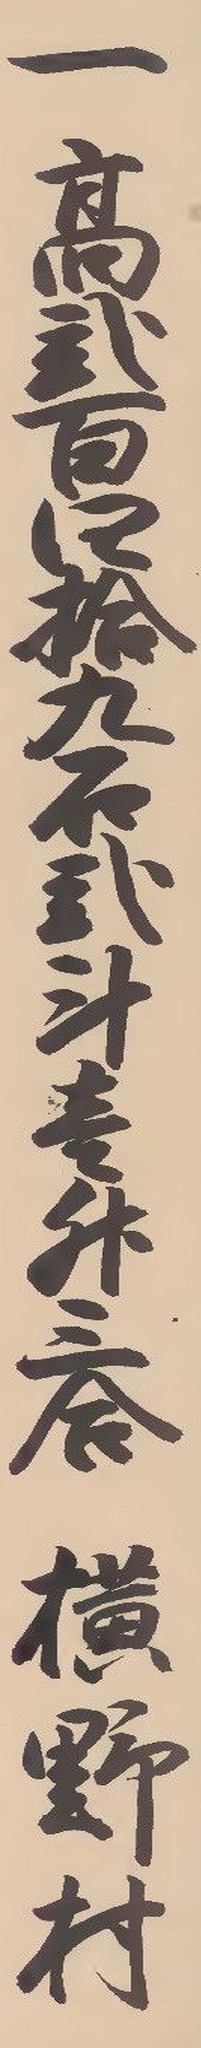一高弐百四拾九石弐斗壱升三合横野村
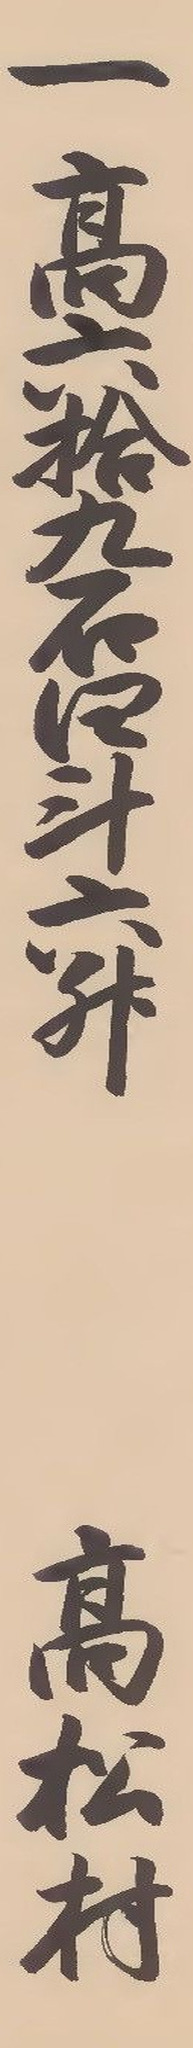一高六拾九石四斗六升高松村
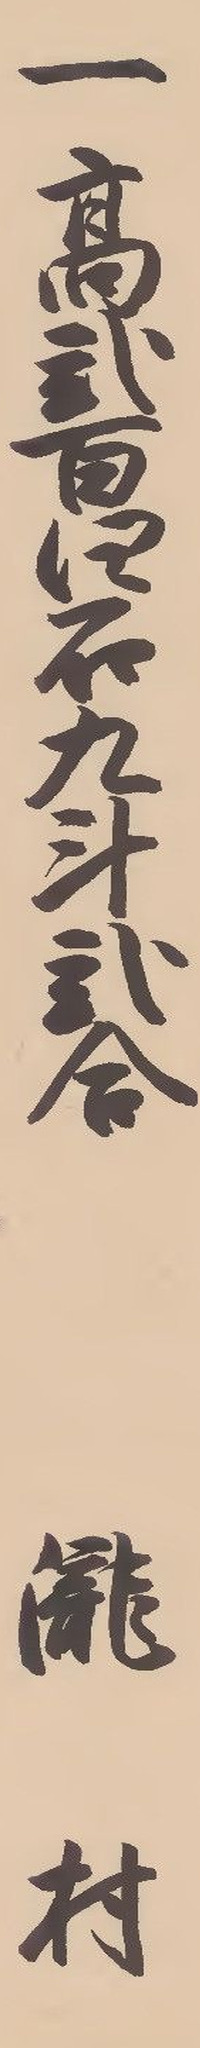一高弐百四石九斗弐合滝村
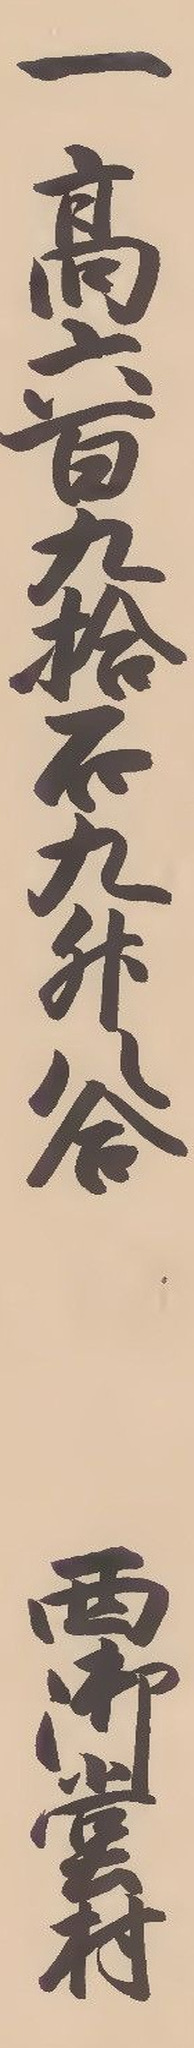一高六百九拾石九升八合西御堂村

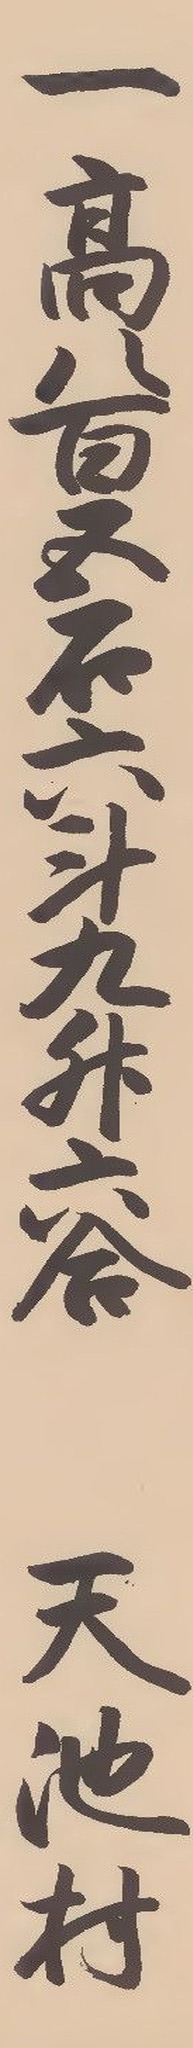一高八百五石六斗九升六合天池村
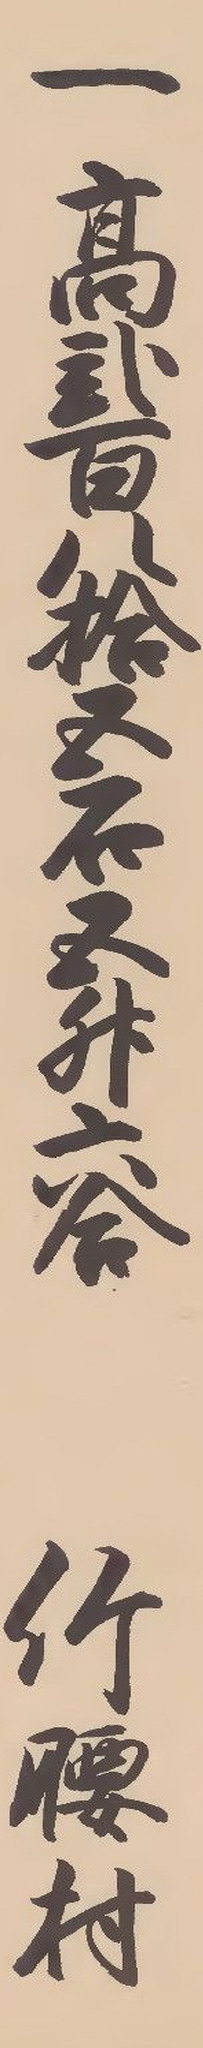一高弐百八拾五石五升六合竹腰村
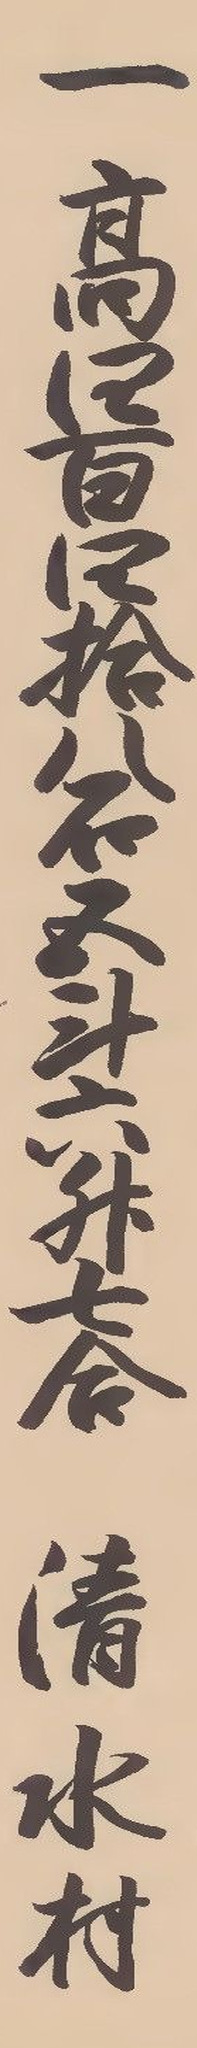一高四百四拾八石五斗六升七合清水村
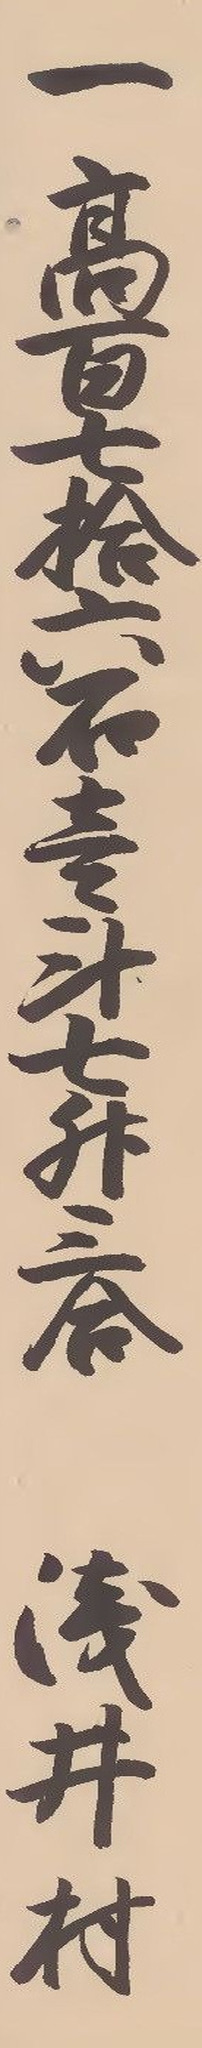一高百七拾六石壱斗七升三合浅井村
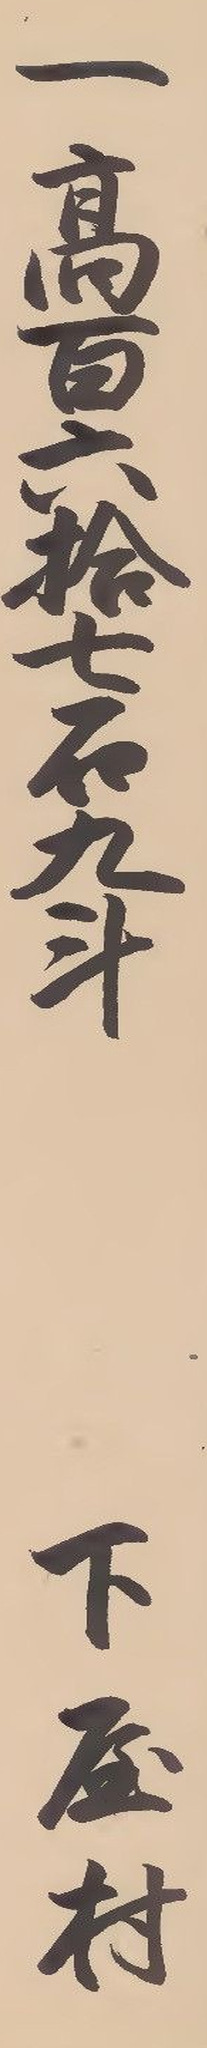一高百六拾七石九斗下屋村
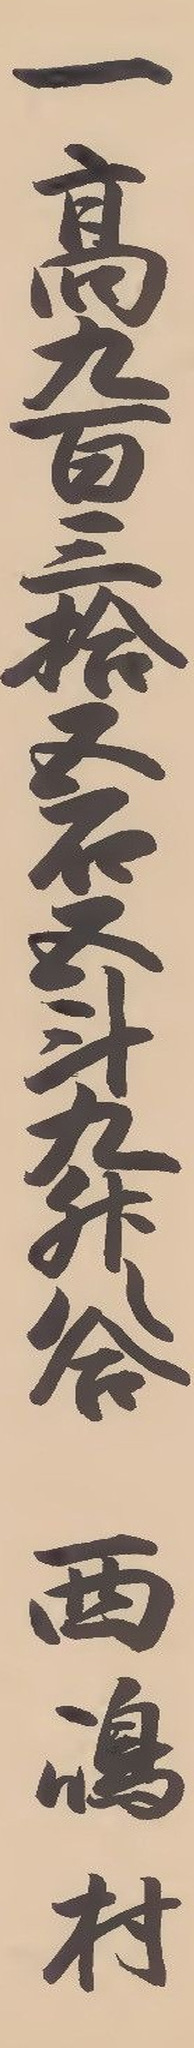一高九百三拾五石五斗九升八合西島村
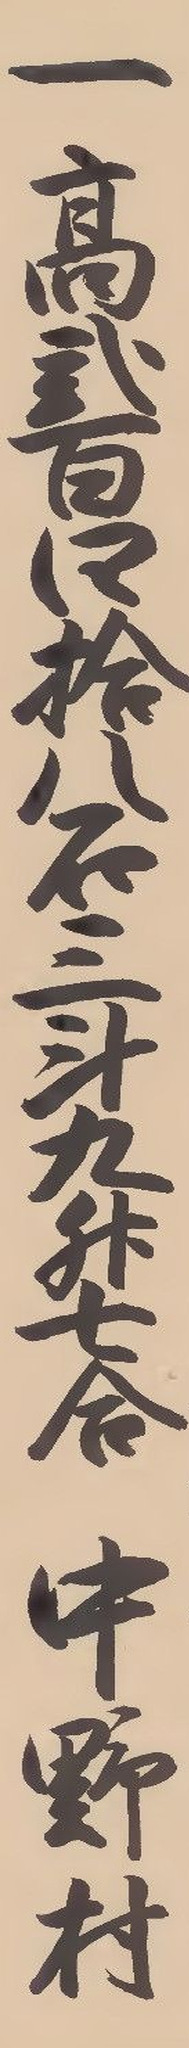一高四百四拾八石五斗六升七合清水村
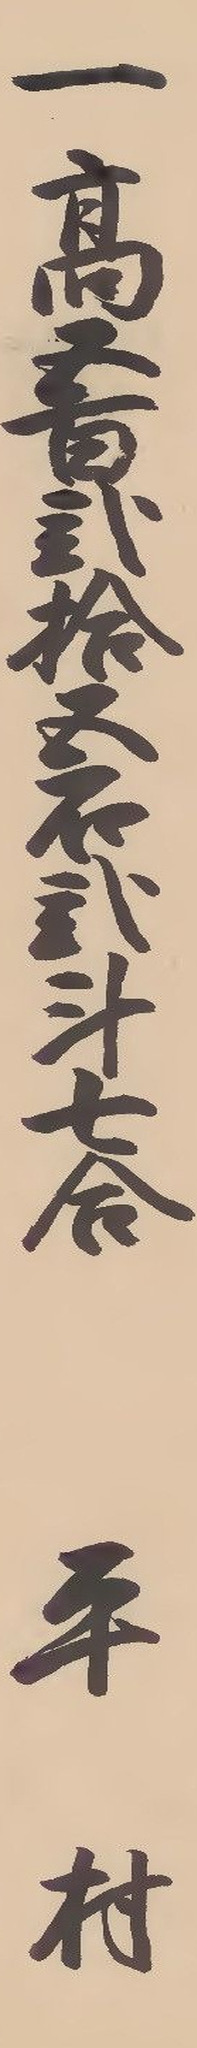一高五百弐拾五石弐斗七合平村
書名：尾張国郷帳
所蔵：国立公文書館 National Archives of Japan
